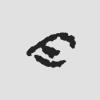日
